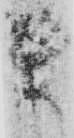樂
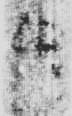思
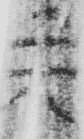而
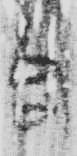句（後）
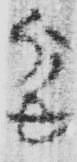忻
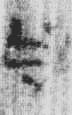凡
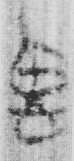思
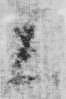之
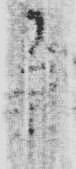甬（用）
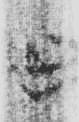心
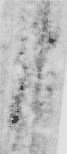爲
